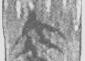六
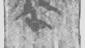十
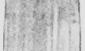一
